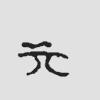亓（其）
